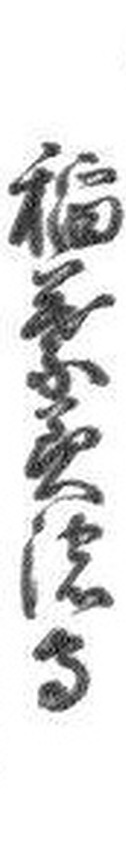稲葉美濃守
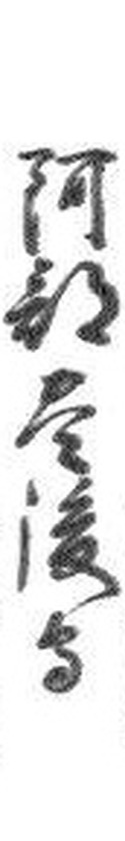阿部豊後守
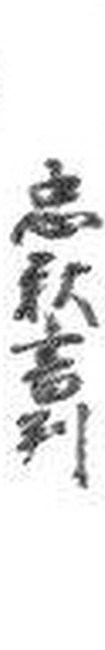忠秋書判
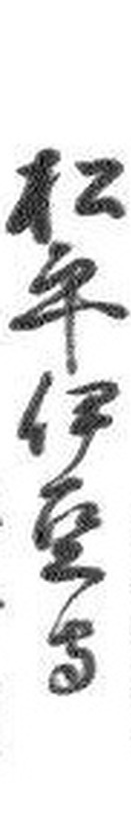松平伊豆守
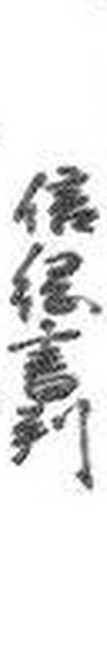信綱書判
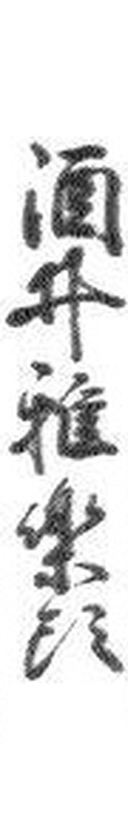酒井雅樂頭
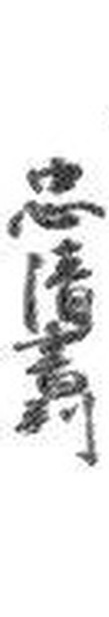忠清書判
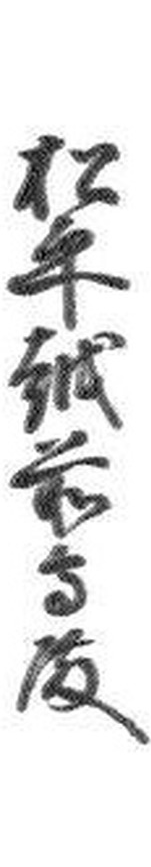松平越前守殿

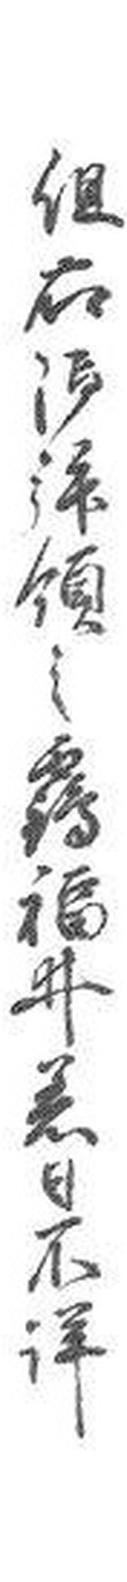但右御拝領之鶴福井着日不詳
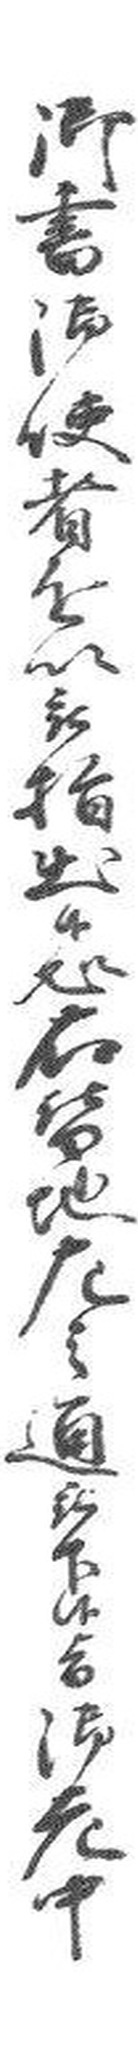御書御使者を以被指出候処右替地左之通被下候旨御老中
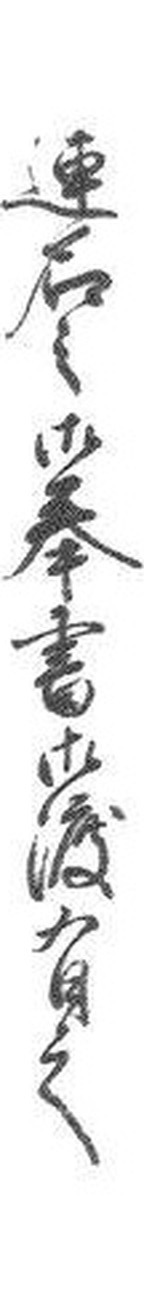連名之御奉書御渡有之
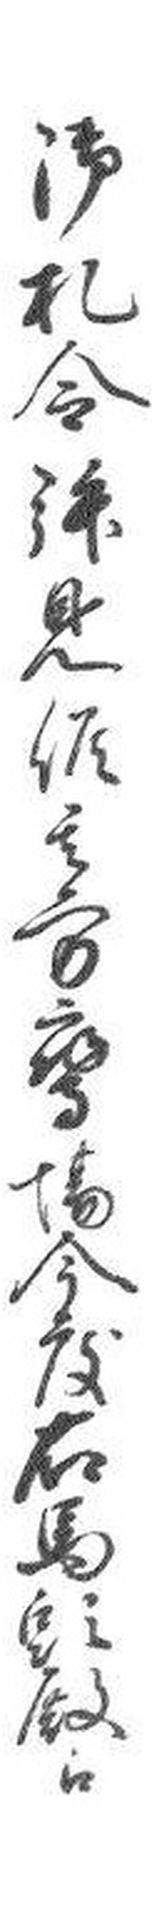御札令拝見候其方鷹場今度右馬頭殿江
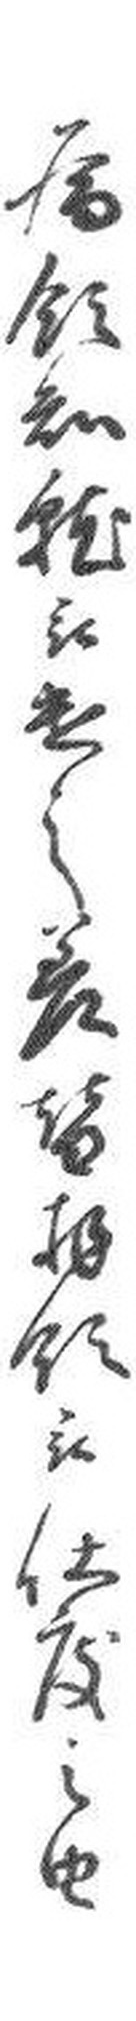為領知就被遣之差替拝領被仕度之由
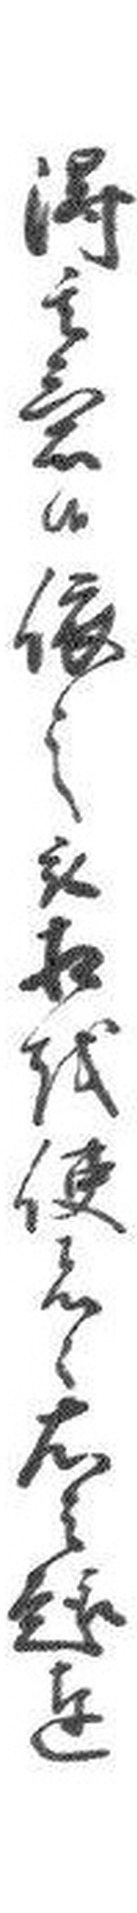得其意候依之被相越使者候右之趣達
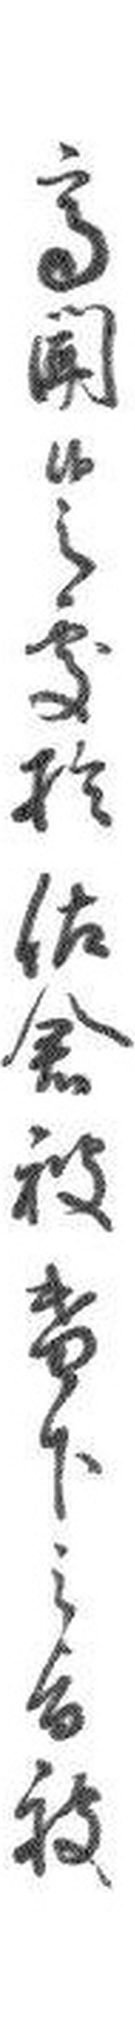高聞候之処於佐倉被替下之旨被
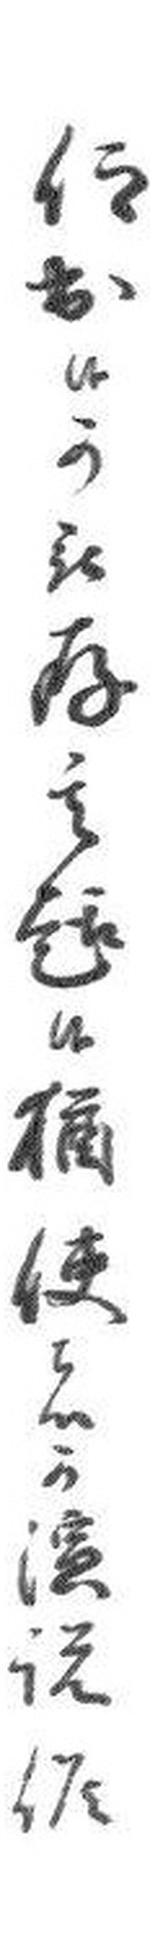仰出候可被存其趣候猶使者可演説候
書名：家譜 六 光通公 従万治三年到寛文三年
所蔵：福井県文書館 Fukui Prefectural Archives
